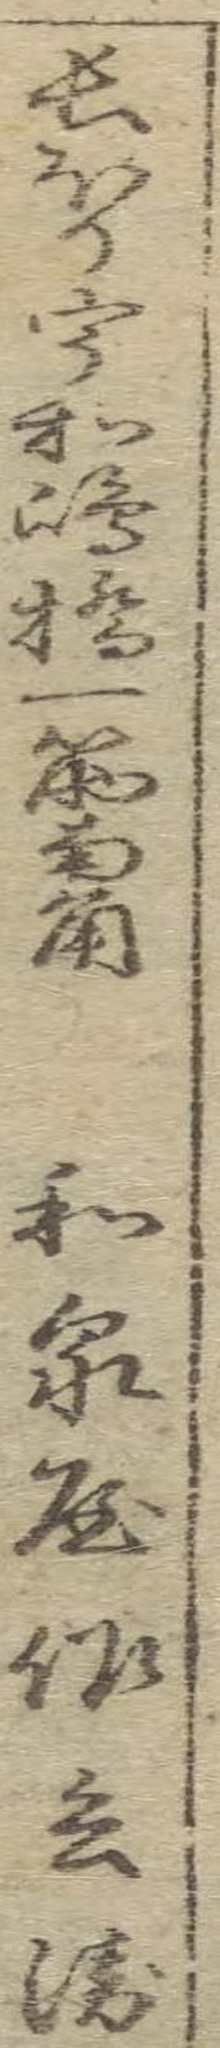長ほり宇和嶋橋一筋南角和泉屋作兵衛
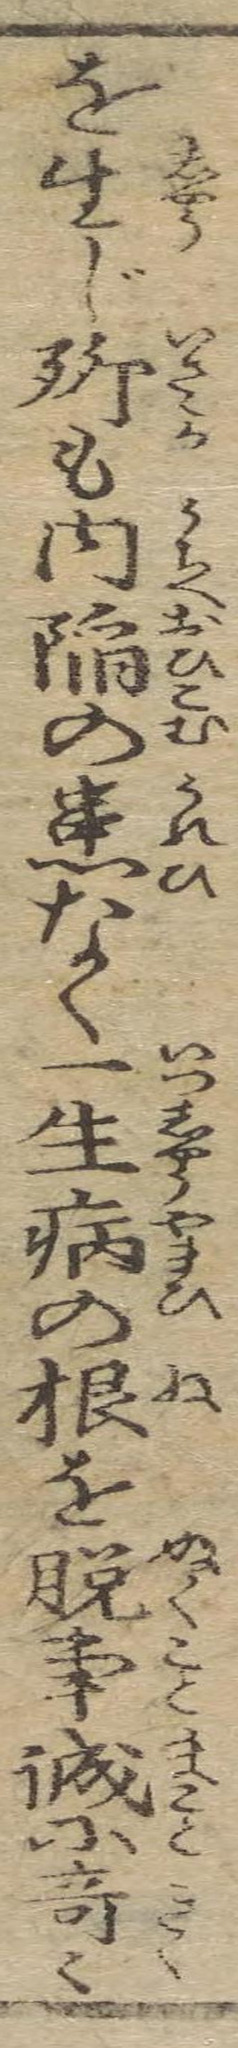を生じ聊も内陥の患なく一生病の根を脱事誠に奇々
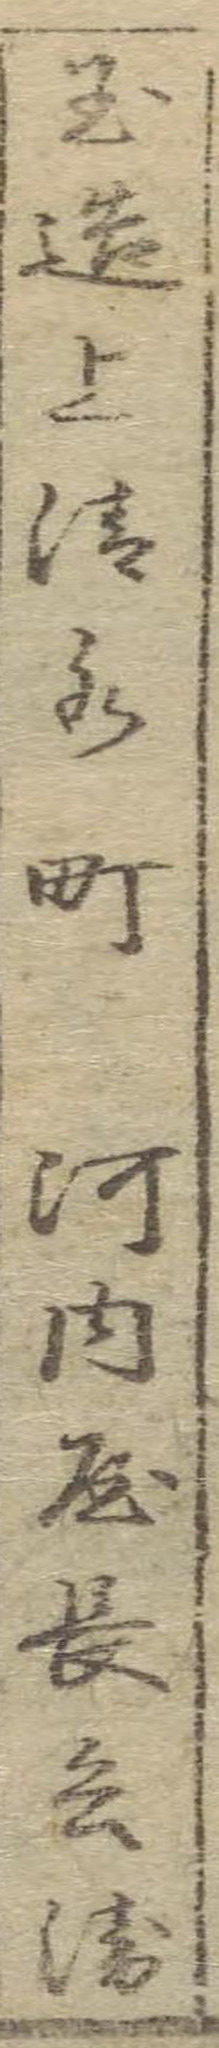玉造上清水町河内屋長兵衛
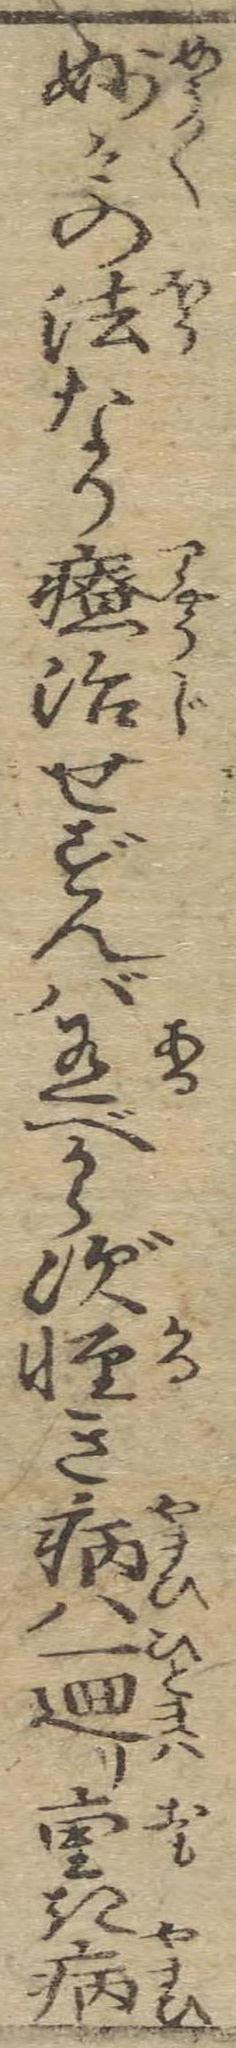妙々の法なり療治せずんば有べからず軽き病は一廻重き病
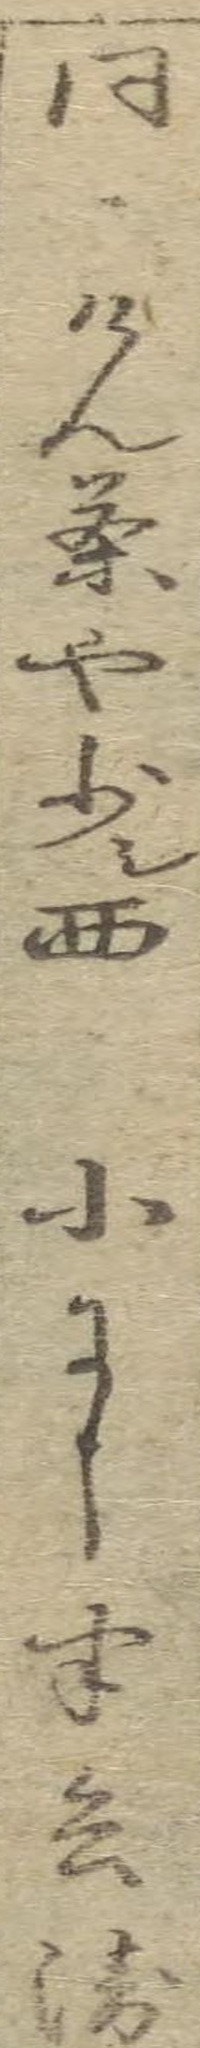同けん茶や少し西小にし半兵衛
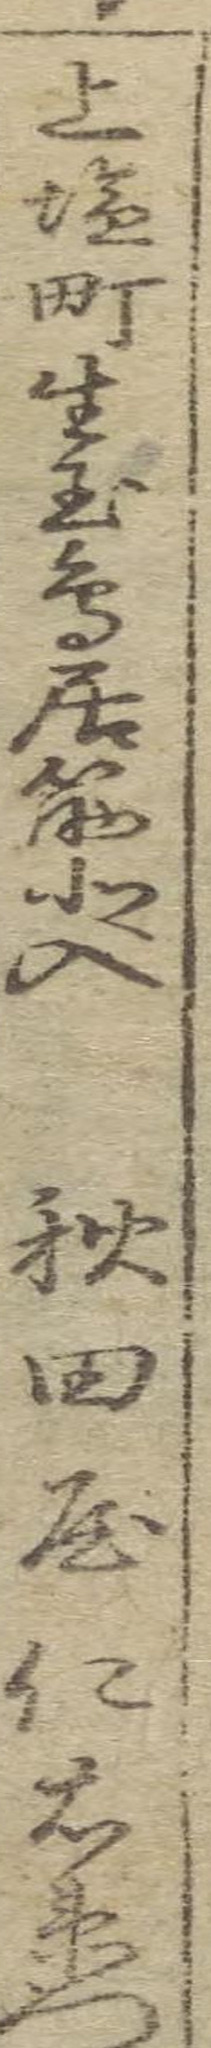上塩町生玉鳥居筋北へ入秋田屋仁右衛門
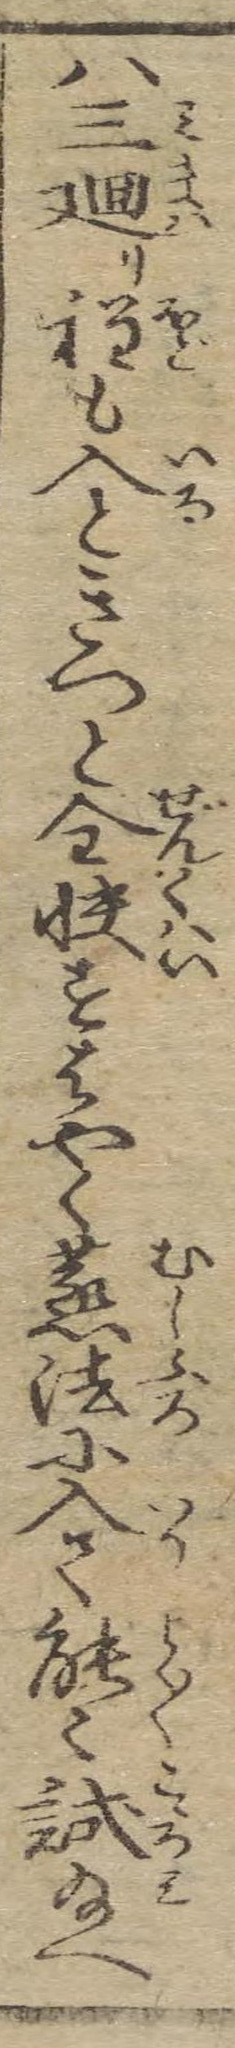は三廻程も入ときつと全快すはやく蒸法に入て能々試給へ
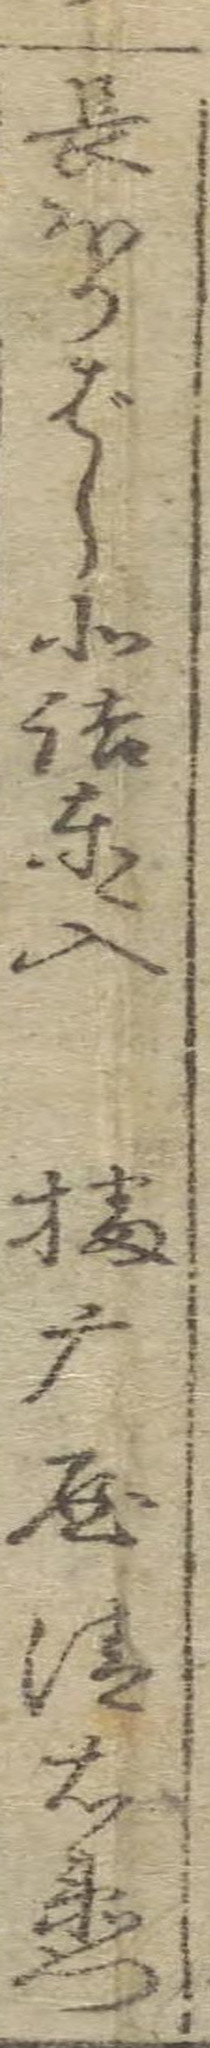長ほりばし北詰東へ入播磨屋清右衛門
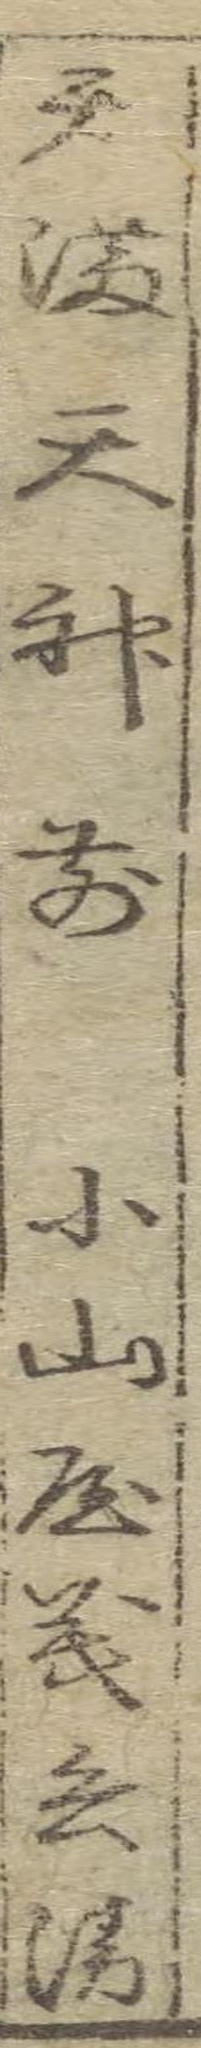天満天神前小山屋義兵衛
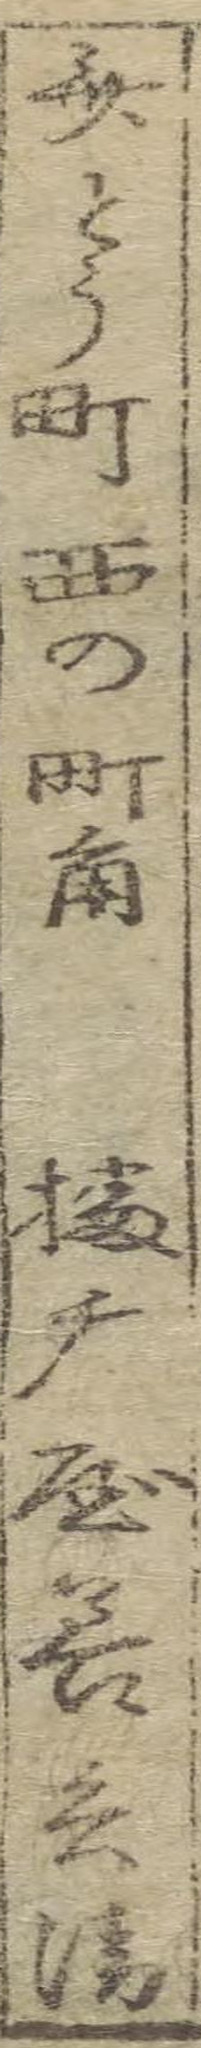斉とう町西の町角播磨屋善兵衛
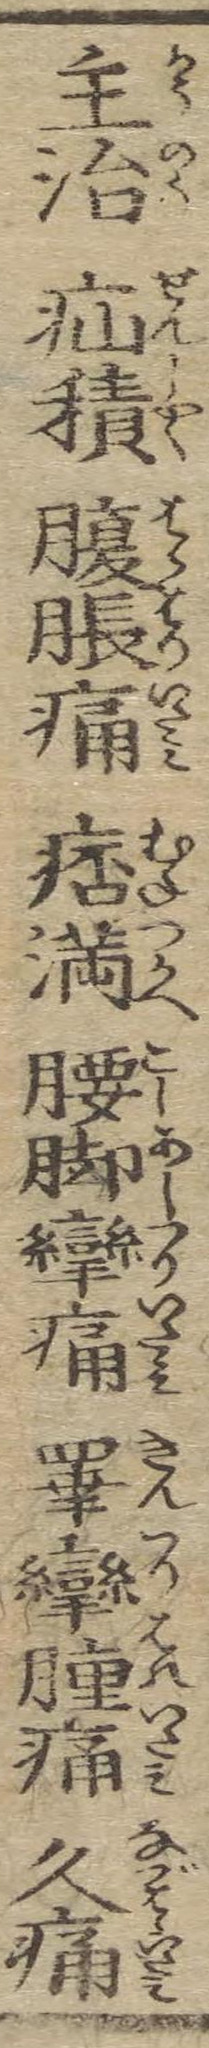主治疝積腹脹痛痞満腰脚攣痛睪攣腫痛久痛
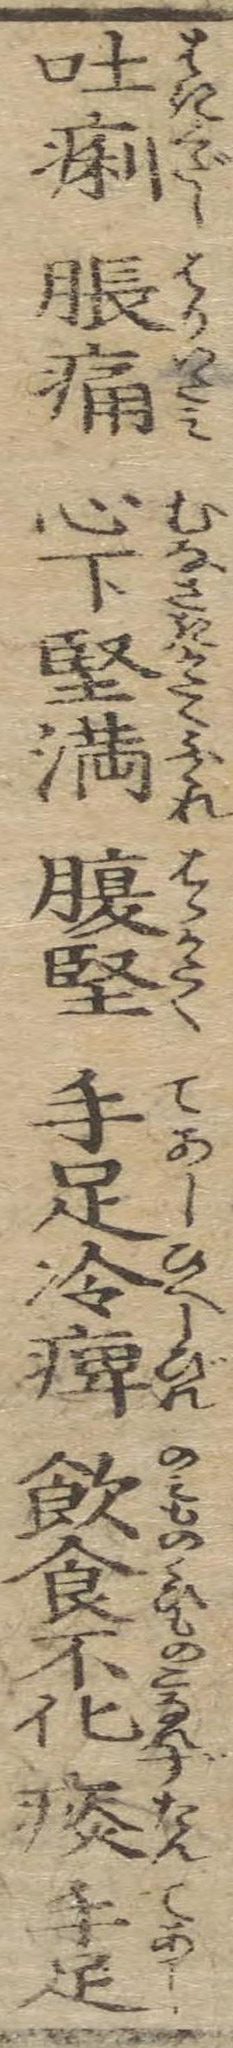吐痢脹痛心下堅満腹堅手足冷痺飲食不化痰手足
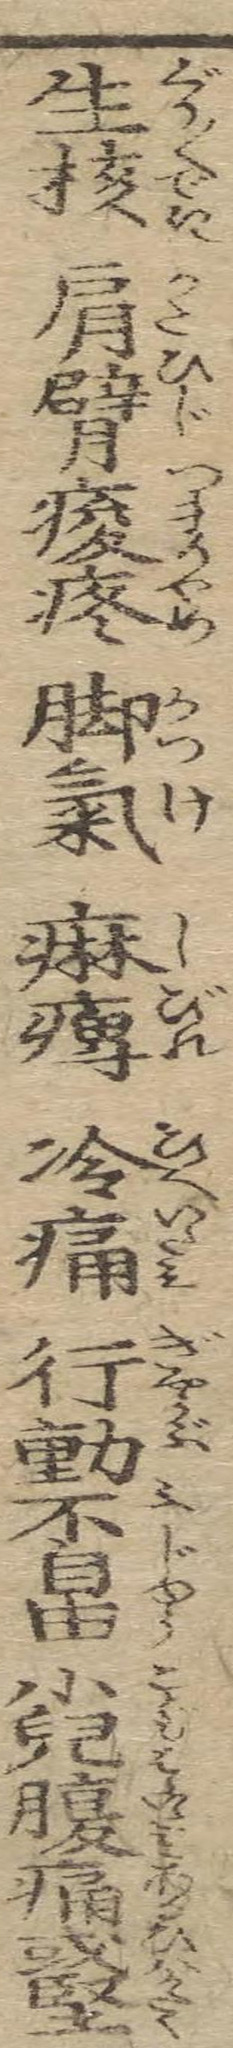生核肩臂痠疼脚気痳痺冷痛行動不自由小児腹痛或堅
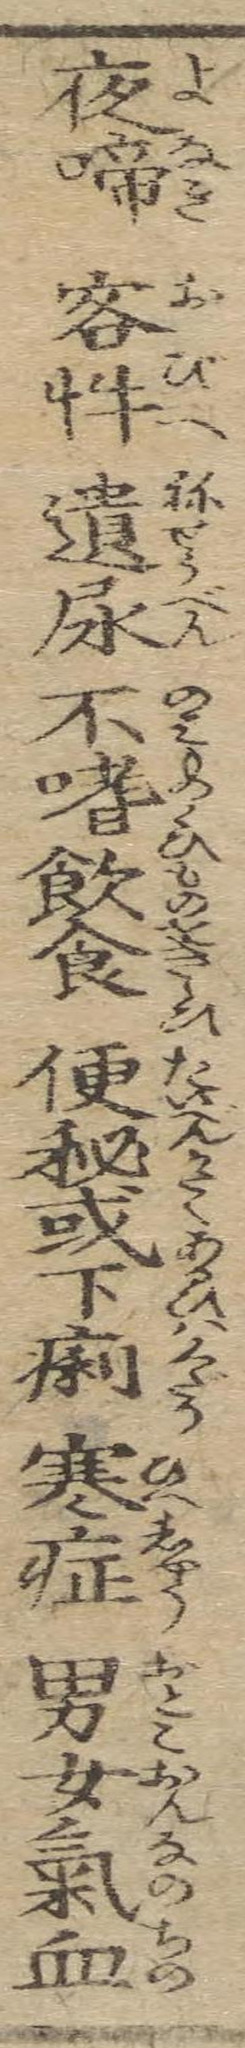夜啼客忤遺尿不嗜飲食便秘或下痢寒症男女気血
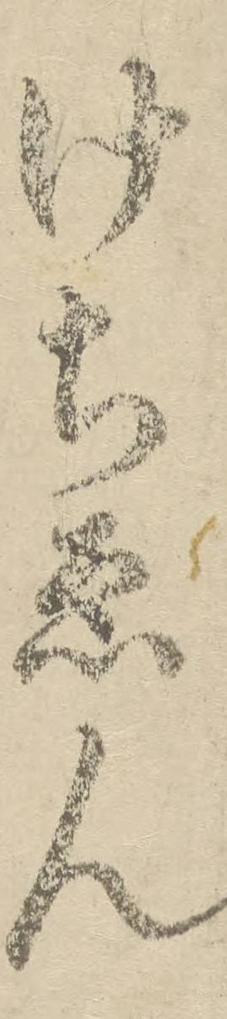けちゑん
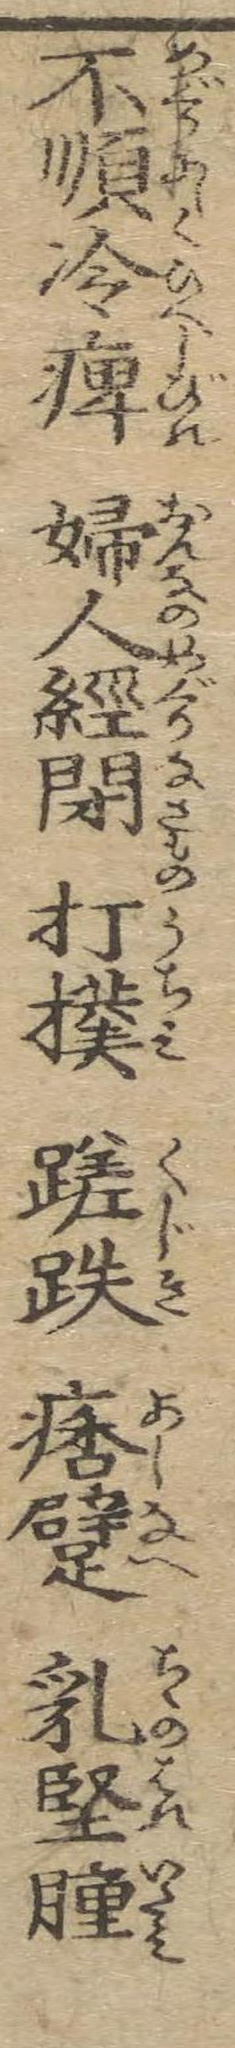不順冷痹婦人経閉打撲蹉跌痿躄乳堅腫
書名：浪華薬種問屋能書張交帖. 二
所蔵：国立国会図書館 National Diet Library, JAPAN
